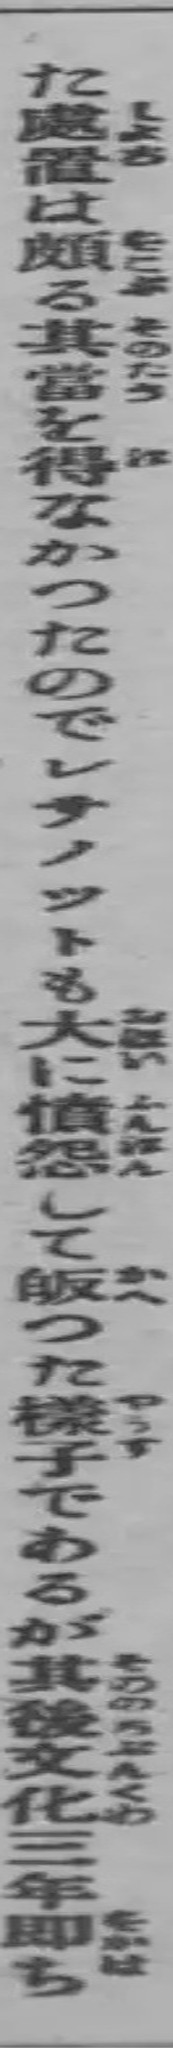た処置は頗る其当を得なかつたのでレサノツトも大に憤怨して皈つた様子であるが其後文化三年即ち
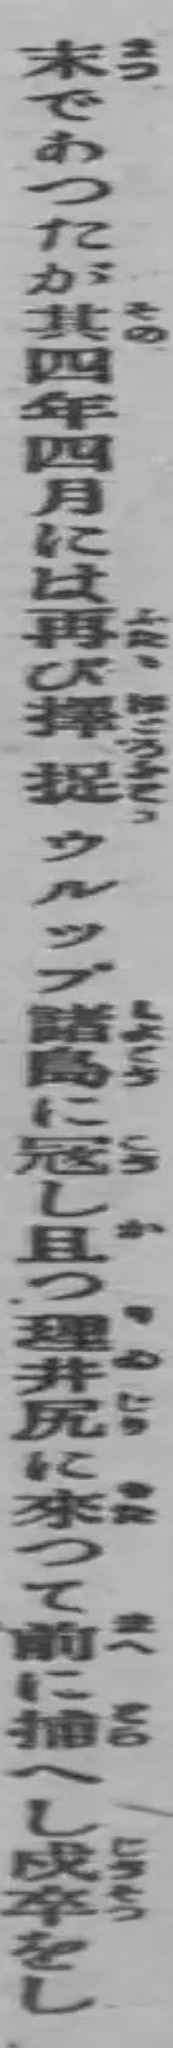末であつたが其四年四月には再び択捉ウルツプ諸島に寇し且つ理井尻に来つて前に捕へし戌卒をし
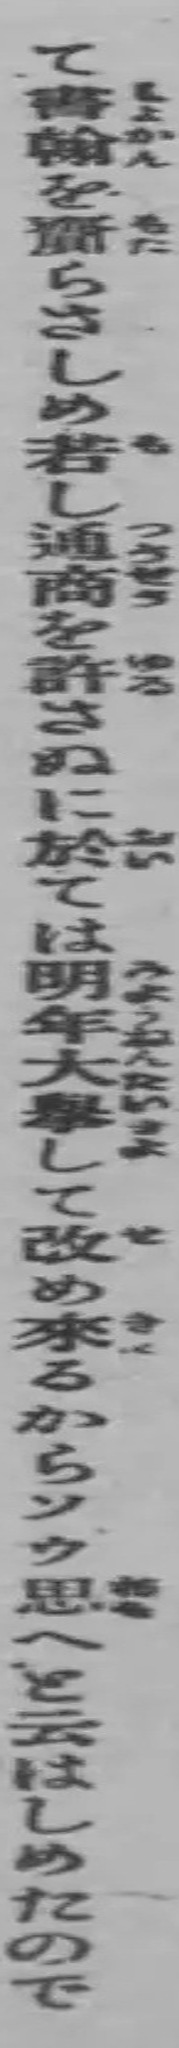て書翰を齎らさしめ若し通商を許さぬに於ては明年大挙して攻め来るからソウ思へと云はしめたので
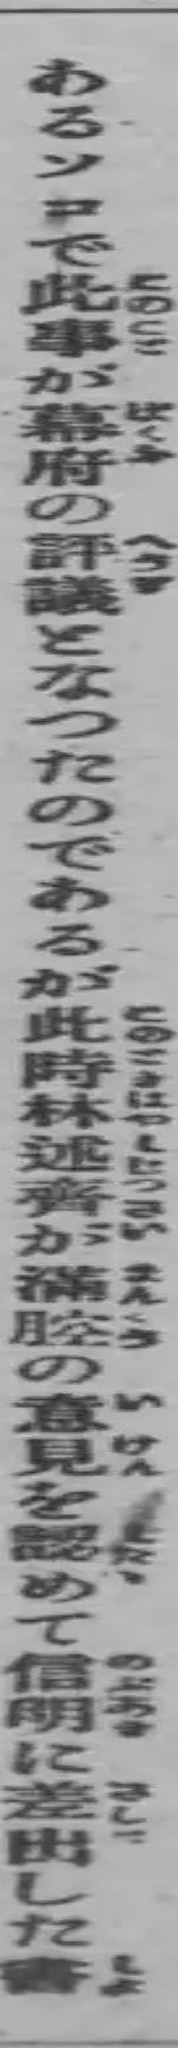あるソコで此事が幕府の評議となつたのであるが此時林述斉が満腔の意見を認めて信明に差出した書
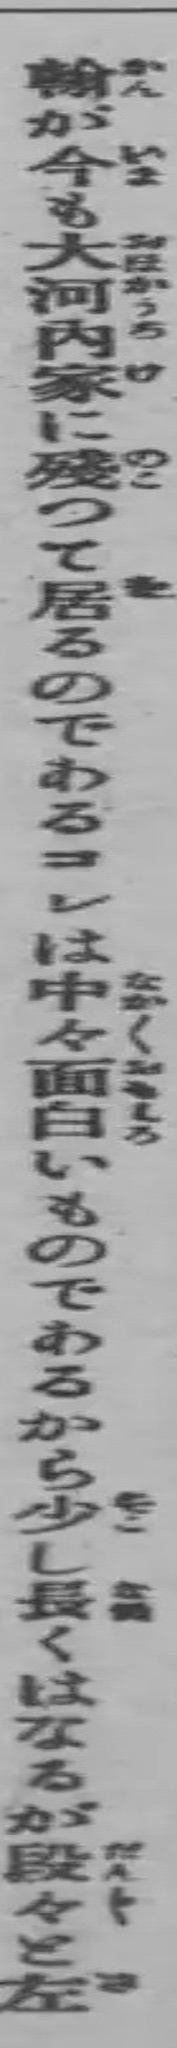翰が今も大河内家に残つて居るのであるコレは中々面白いものであるから少し長くはなるが段々と左
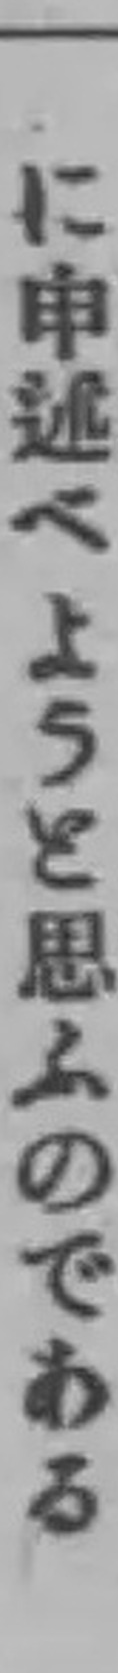に申述べようと思ふのである
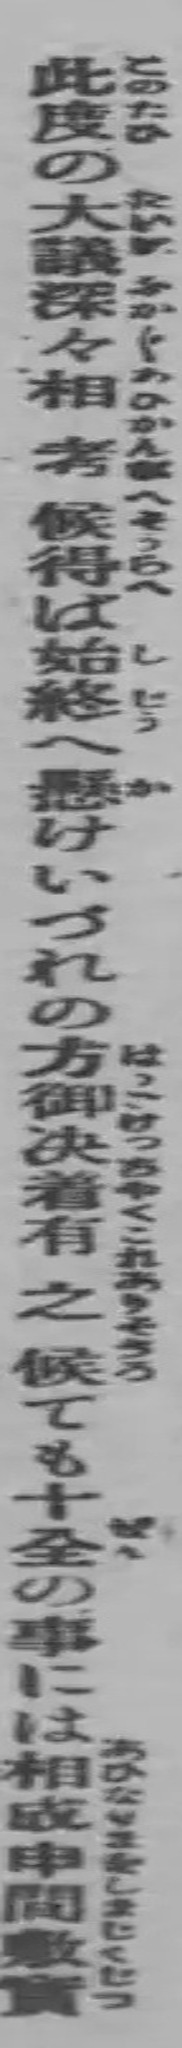此度の大議深々相考候得ば始終へ懸けいづれの方御決着有之候ても十全の事には相成申間敷実
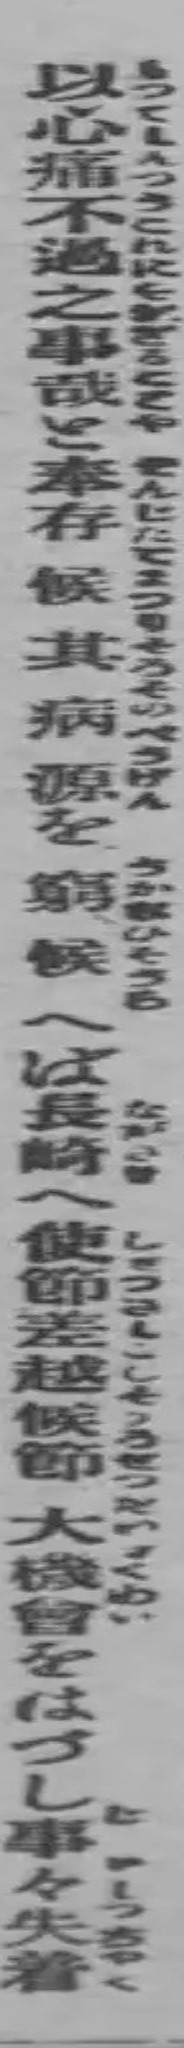以心痛不過之事哉と奉存候其病源を窺候へば長崎へ使節差越候節大機会をはづし事々失着
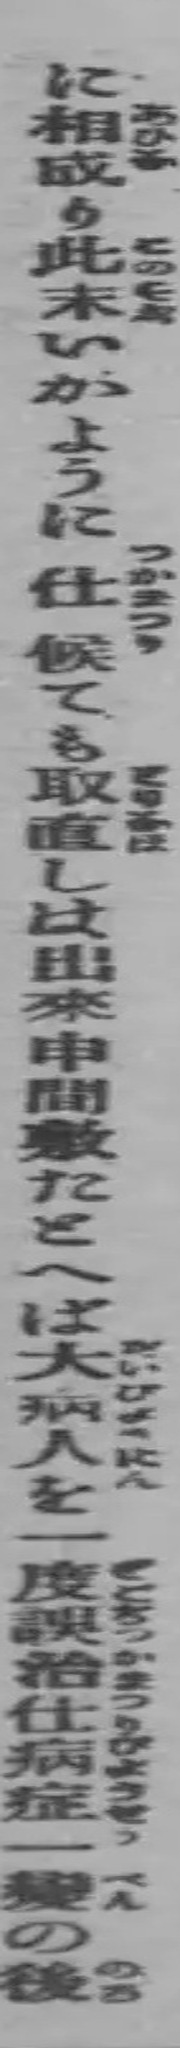に相成り此末いかように仕候ても取直しは出来申間敷たとへば大病人を一度誤治仕病症一変の後

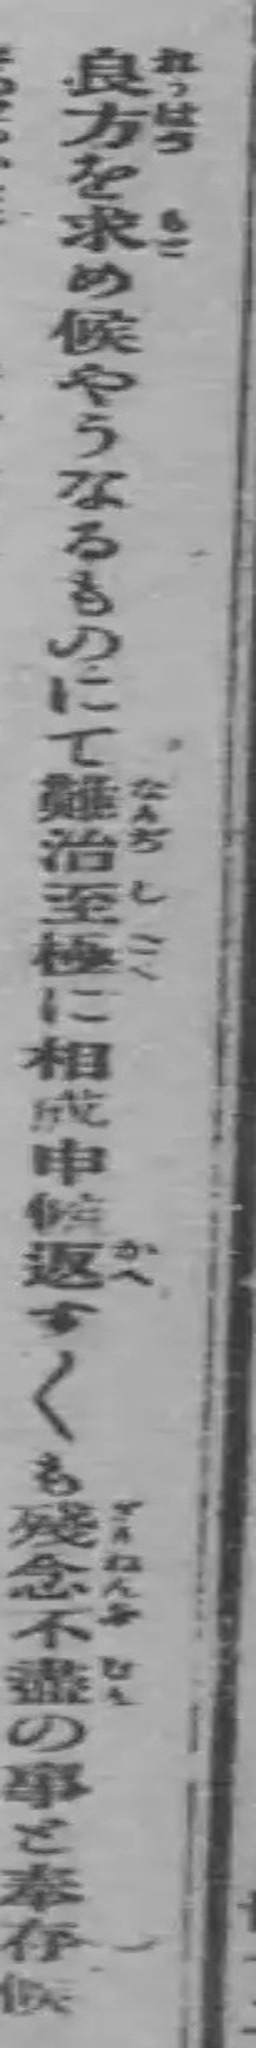良方を求め候やうなるものにて難治至極に相成申候返す〳〵も残念不尽の事と奉存候
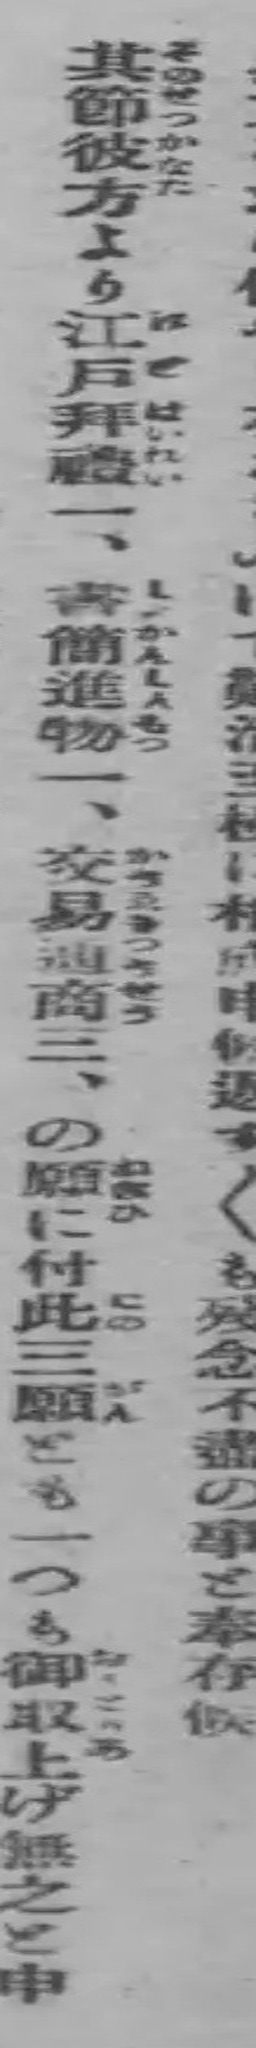其節彼方より江戸拝礼一、書簡進物一、交易通商三、の願に付此三願とも一つも御取上げ無之と申
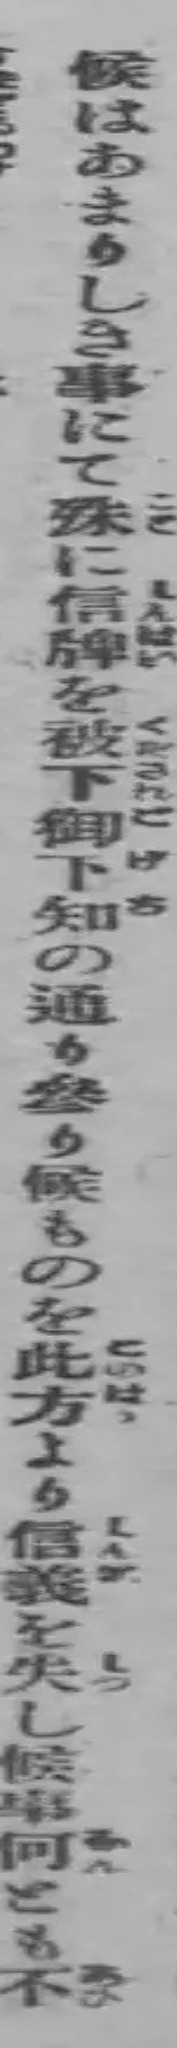候はあまりしき事にて殊に信牌を被下御下知の通り参り候ものを此方より信義を失し候事何とも不
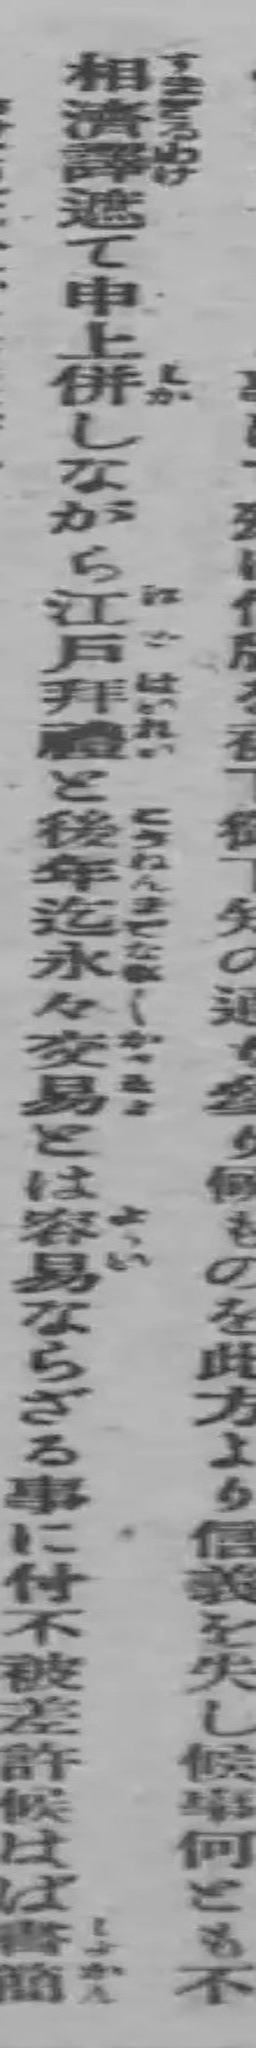相済訳遮て申上併しながら江戸拝礼と後年迄永々交易とは容易ならざる事に付不被差許候はば書簡
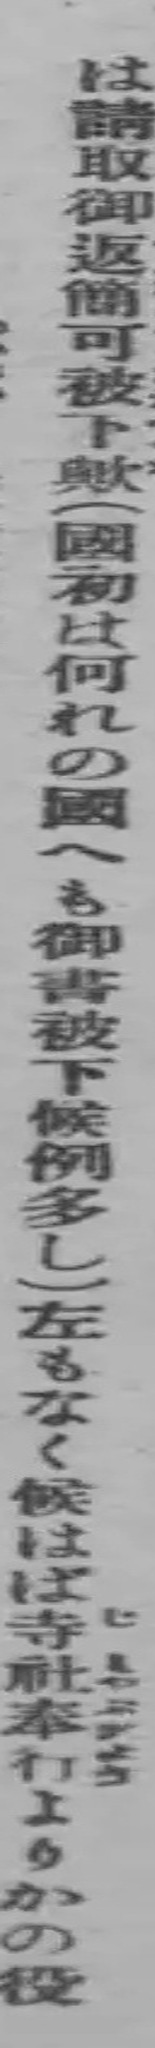は請取御返簡可被下歟(国初は何れの国へも御書被下候例多し)左もなく候はば寺社奉行よりかの役
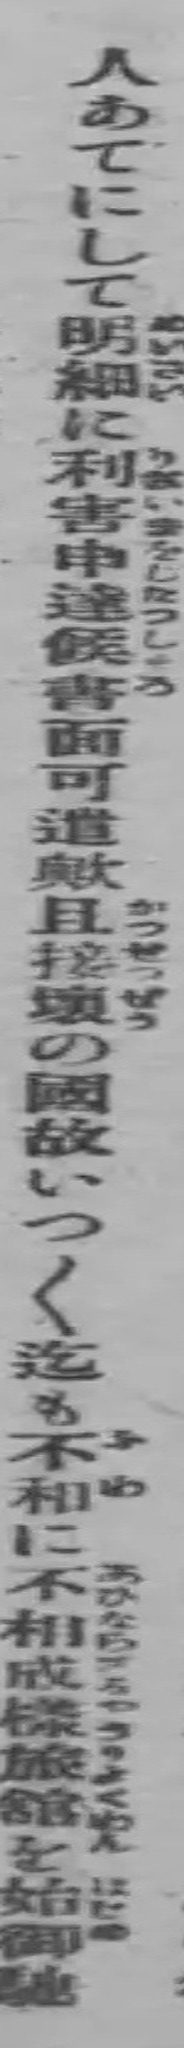人あてにして明細に利害申達候書面可遣歟且接壌の国故いつ〳〵迄も不和に不相成様旅館を始御馳
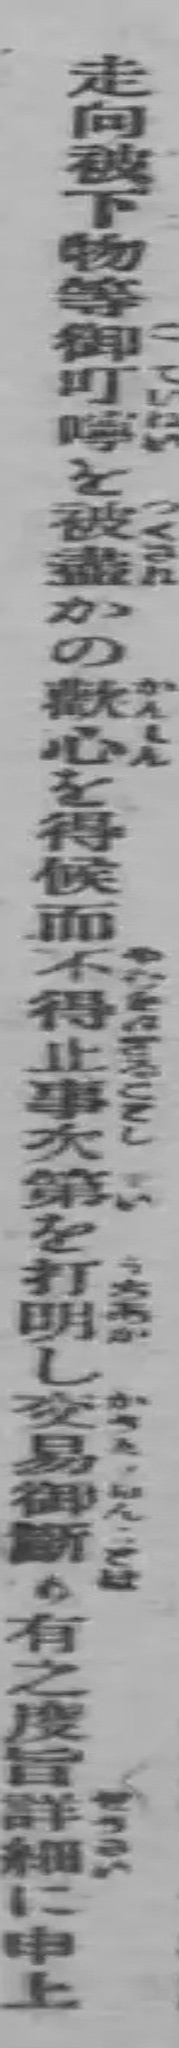走向被下物等御叮嚀を被尽かの歓心を得候而不得止事次第を打明し交易御断り有之度旨詳細に申上
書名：豊橋市史談
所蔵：国立国会図書館 National Diet Library, JAPAN
